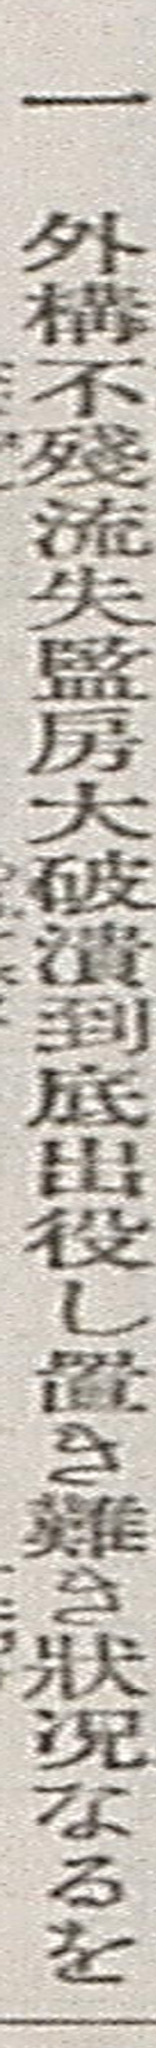一外構不残流失監房大破潰到底出役し置き難き状况なるを
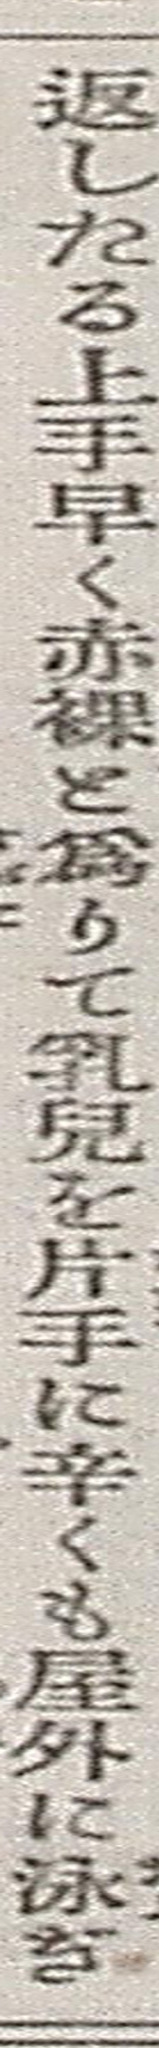返したる上手早く赤裸と為りて乳児を片手に辛くも屋外に泳ぎ
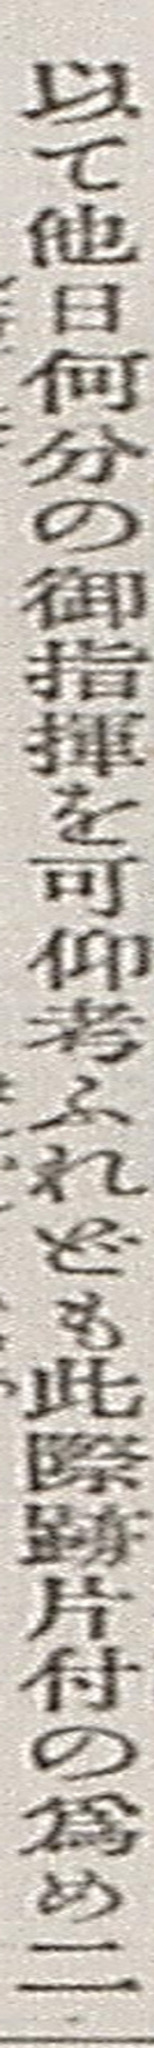以て他日何分の御指揮を可仰考ふれども此際跡片付の為め二
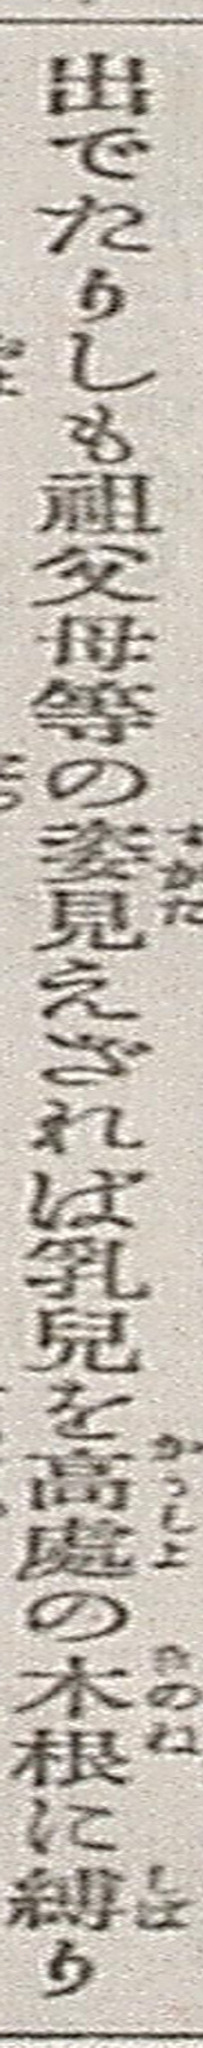出でたりしも祖父母等の姿見えざれば乳児を高処の木根に縛り
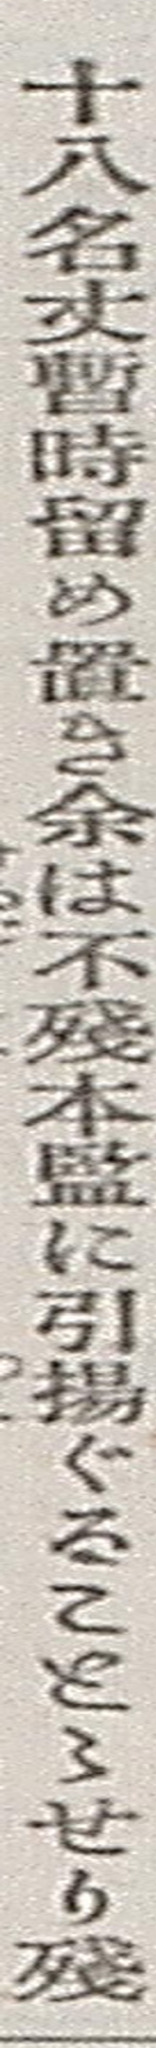十八名丈暫時留め置き余は不残本監に引揚ぐることゝせり残
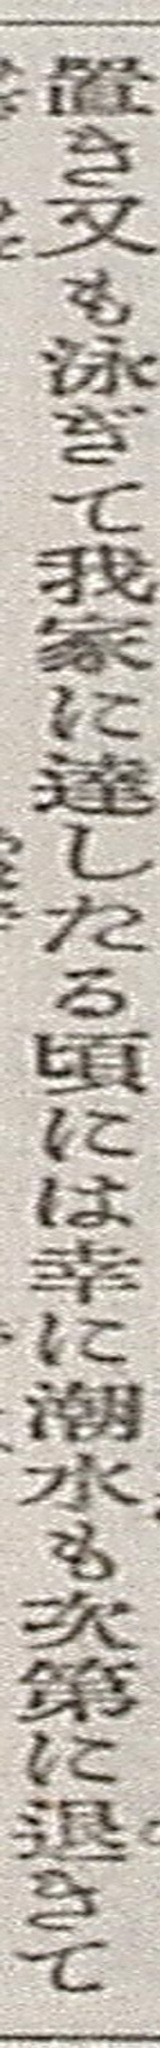置き又も泳ぎて我家に達したる頃には幸に潮水も次第に退きて
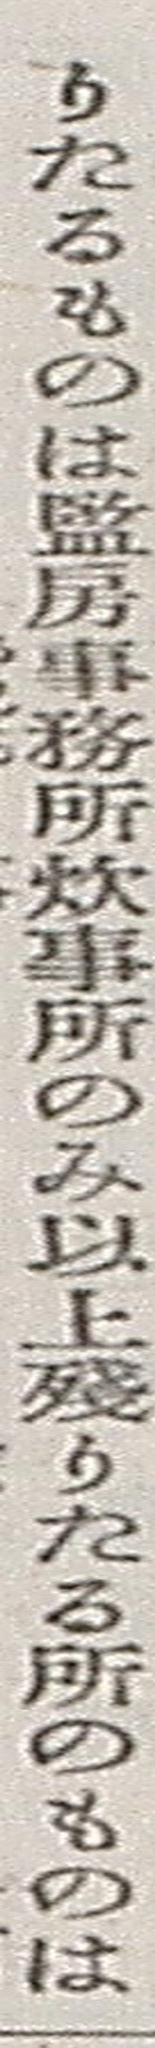りたるものは監房事務所炊事所のみ以上残りたる所のものは
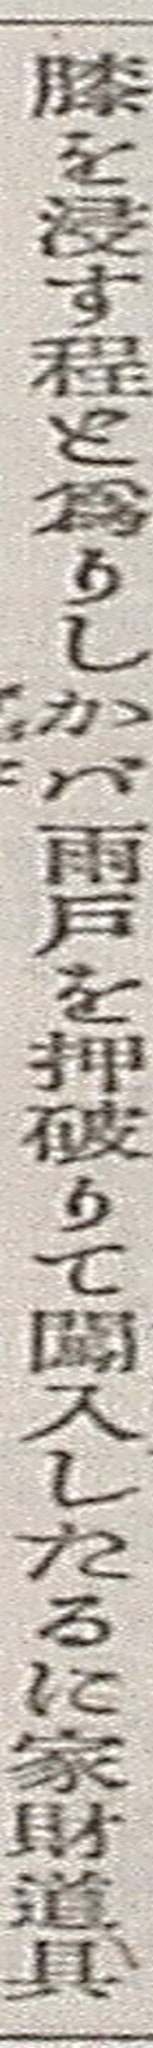膝を浸す程と為りしかば雨戸を押破りて闖入したるに家財道具
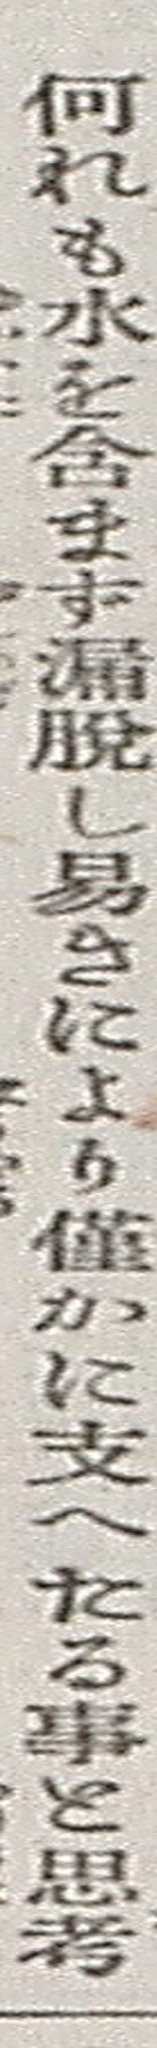何れも水を含まず漏脱し易きにより僅かに支へたる事と思考
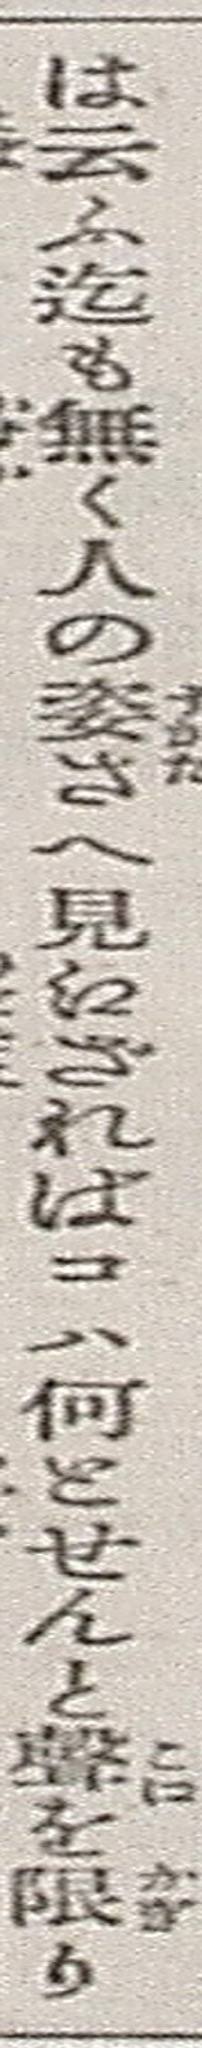は云ふ迄も無く人の姿さへ見えざればこは何とせんと声を限り
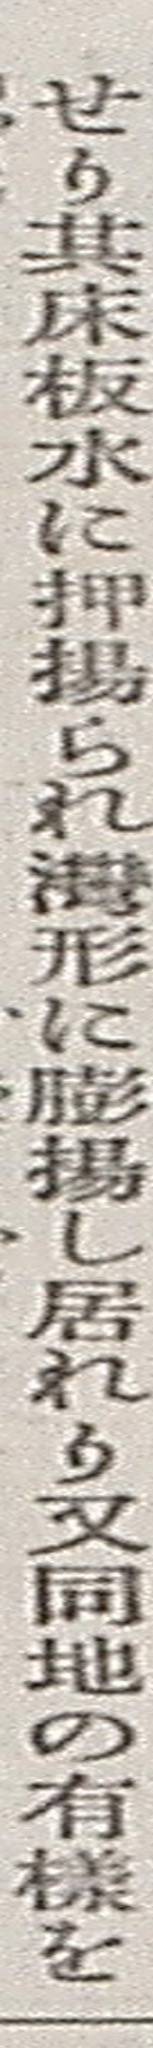せり其床板水に押揚られ湾形に膨揚し居れり又同地の有様を
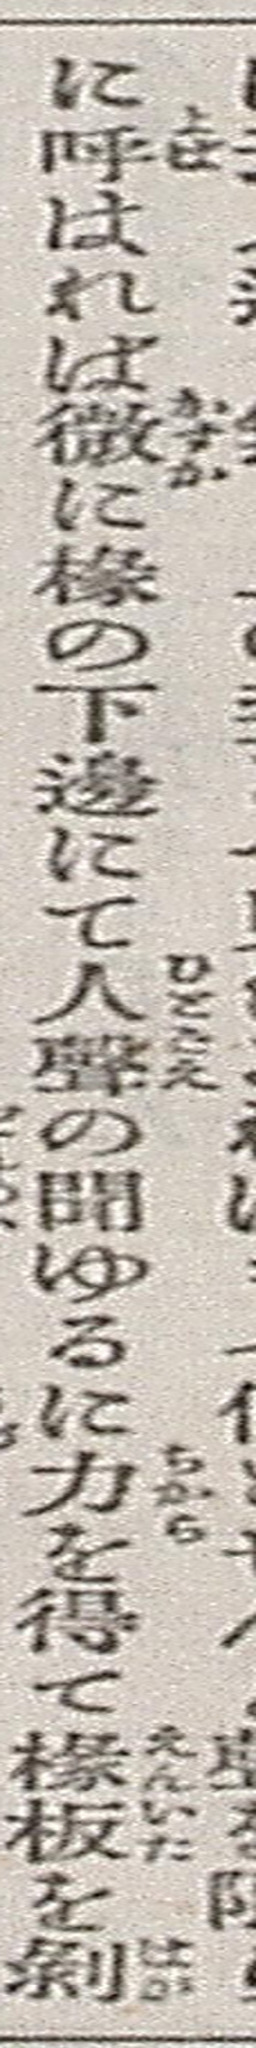に呼はれば微に椽の下辺にて人声の聞ゆるに力を得て椽板を剥
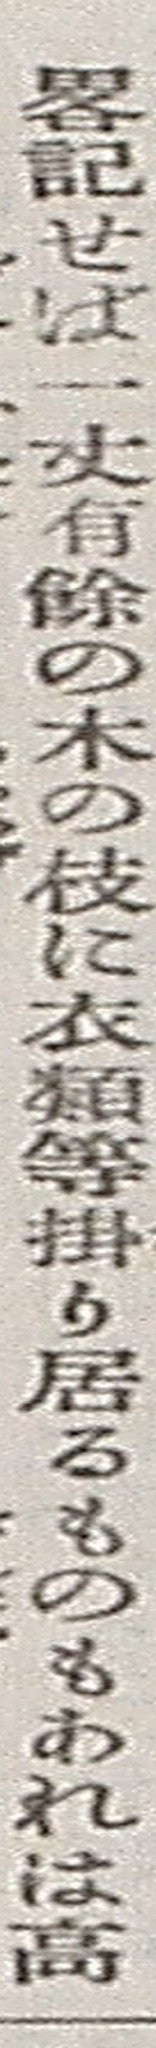略記せば一丈有余の木の枝に衣類等掛り居るものもあれは高
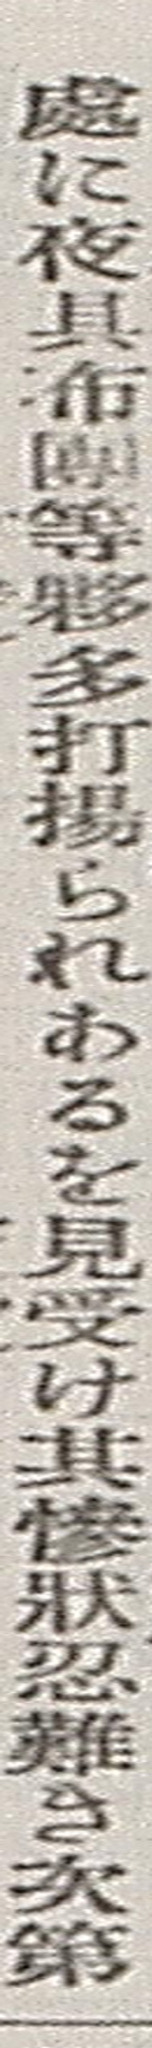処に夜具布団等夥多打揚られあるを見受け其惨状忍難き次第
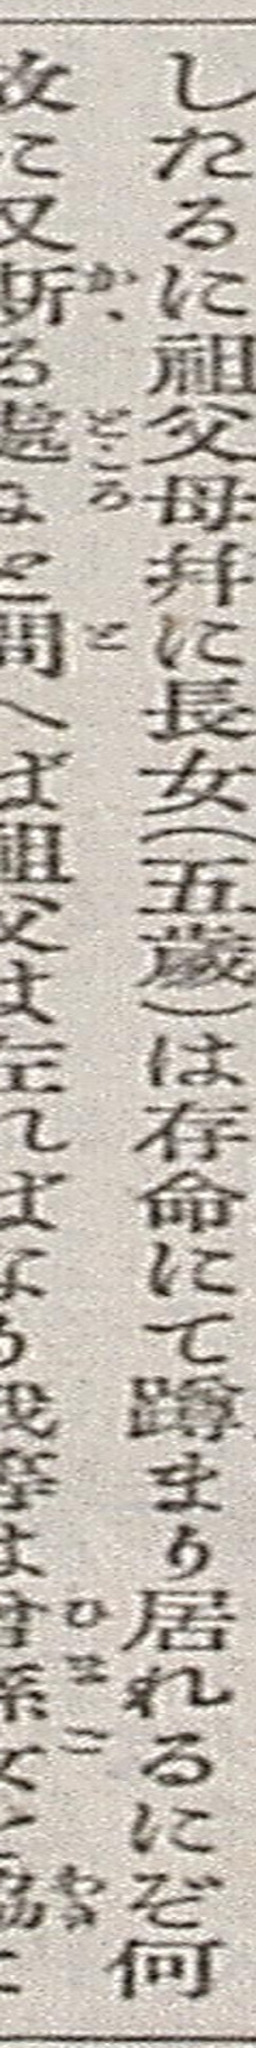故に又斯る処にと問へば祖父は左なればなり我等は曾孫女を脇に
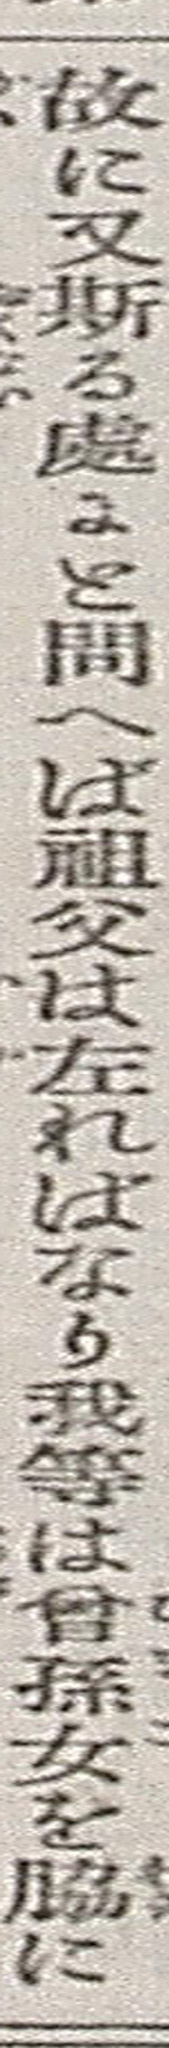故に又斯る処にと問へば祖父は左なればなり我等は曾孫女を脇に
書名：風俗畫報臨時増刊第百十九號　大海嘯被害録（中）
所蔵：東京大学地震研究所図書室 Earthquake Research Institute Library, The University of Tokyo, JAPAN
